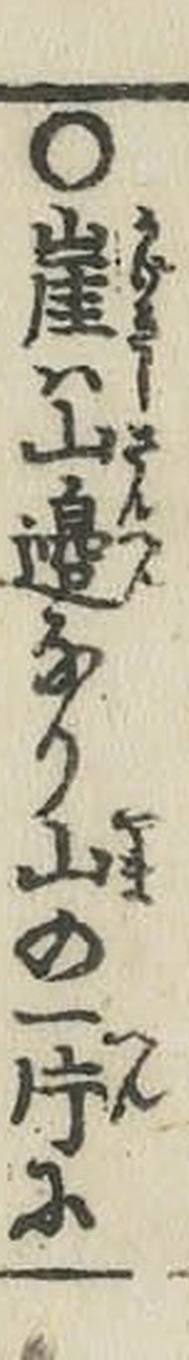○崖は山辺なり山の一片に
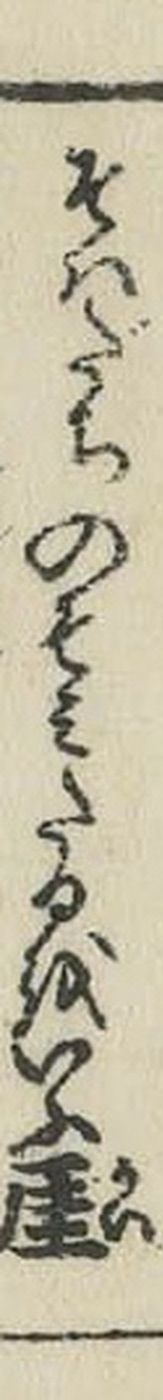そはだちのそみたるをいふ厓
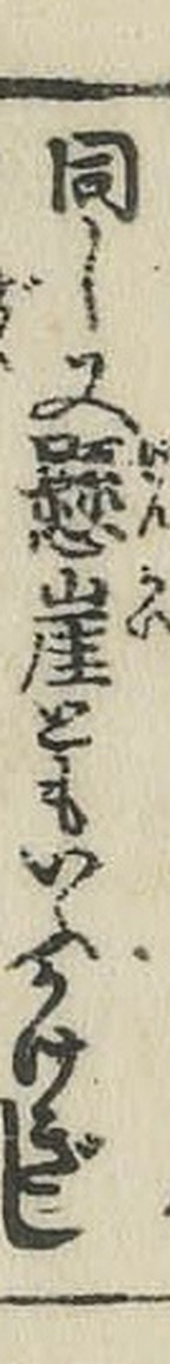同し又懸崖ともいふかけぎし
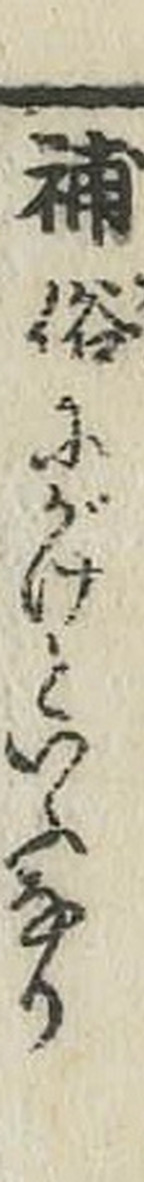補俗にがけといふなり
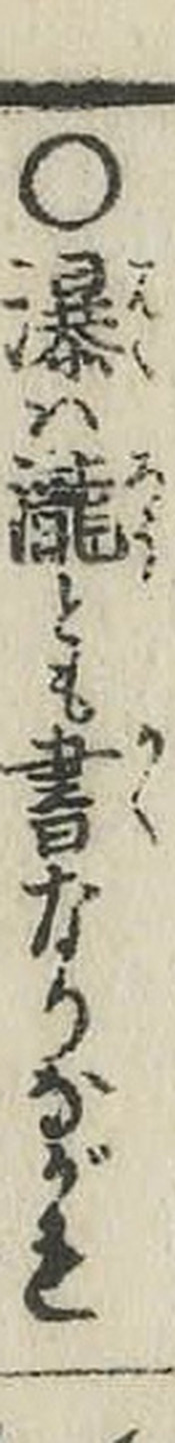○瀑は滝とも書なりながれ
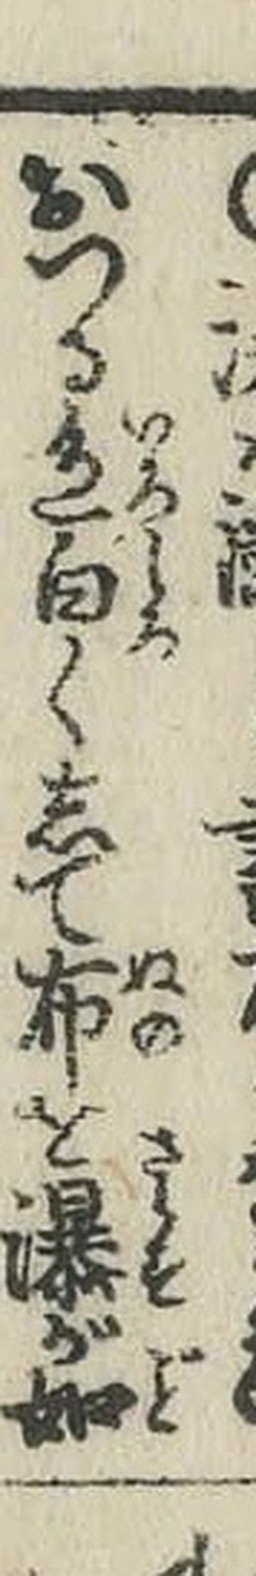おつる色白くして布を瀑が如
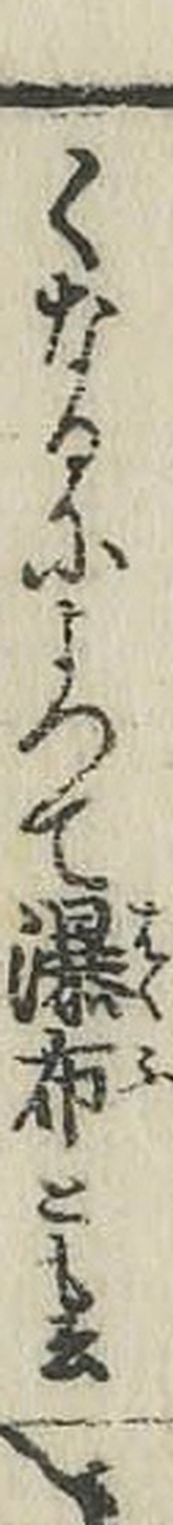くなるによつて瀑布とも云
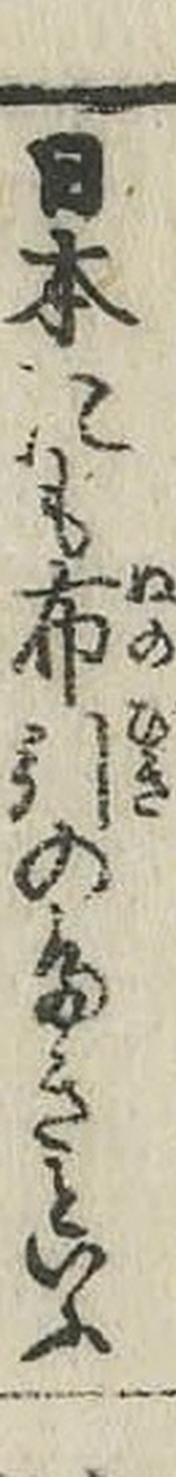日本にも布引のたきといふ
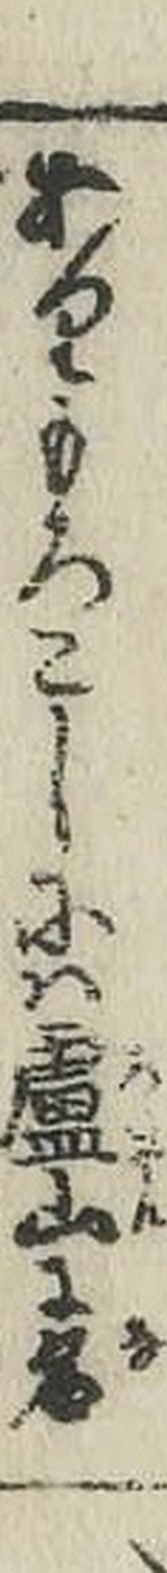ありもろこしには盧山に名
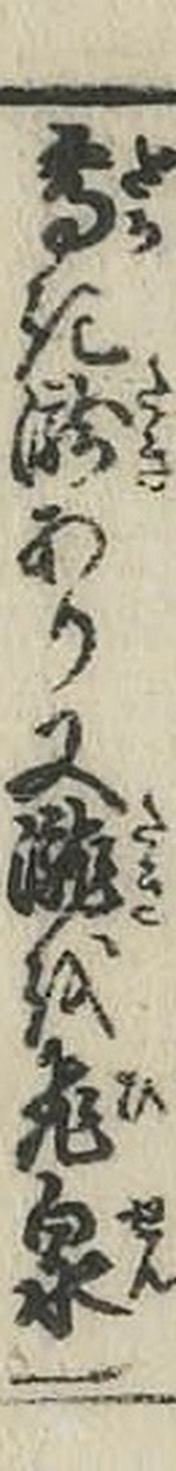高き滝あり又滝を飛泉

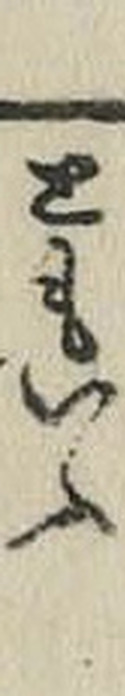ともいふ
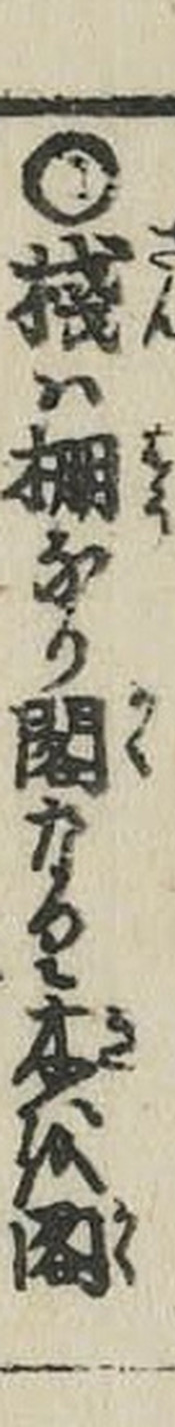○桟は棚なり閣なり木を閣
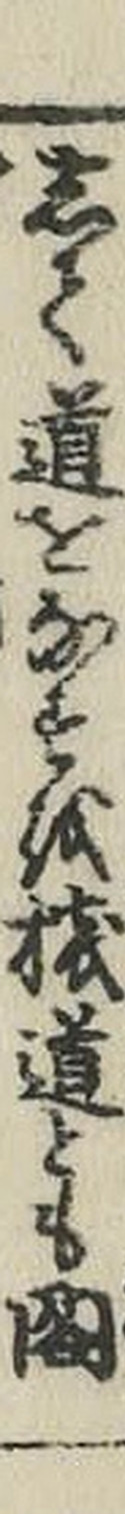して道をなすを桟道とも閣
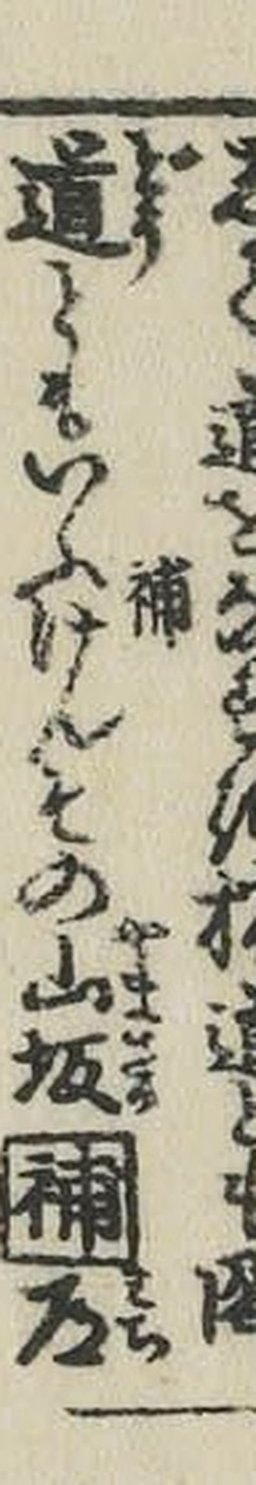道ともいふけんその山坂補道
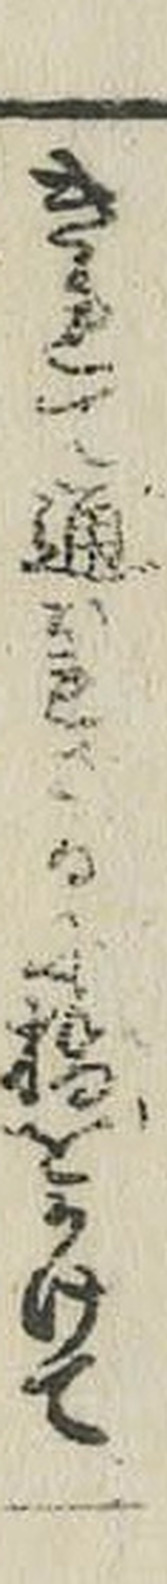きれて通はれざるに橋をかけて
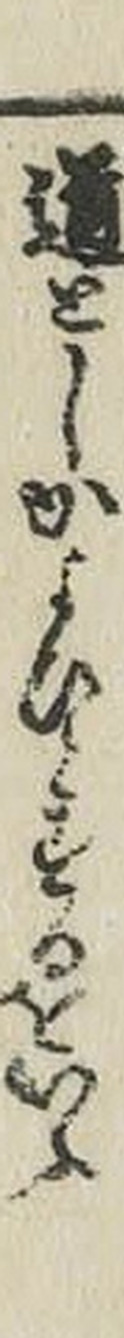道としかよひとするをいふ
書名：増補頭書訓蒙図彙大成 10巻 2:巻之1-3
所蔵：東京学芸大学教育コンテンツアーカイブ
